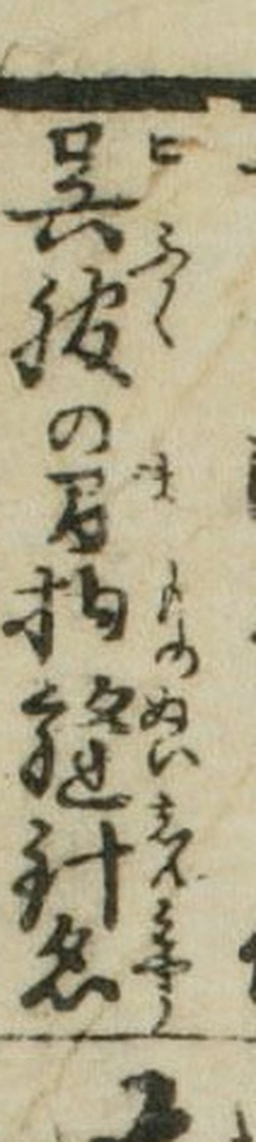呉服の間物縫針名
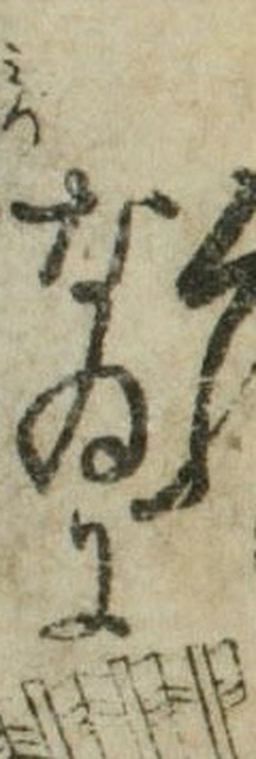なゐに
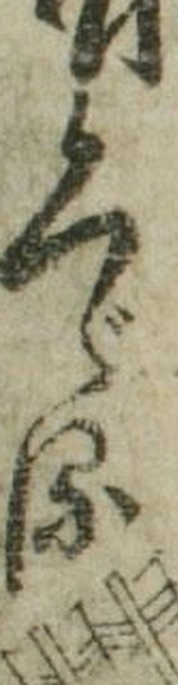くゞる

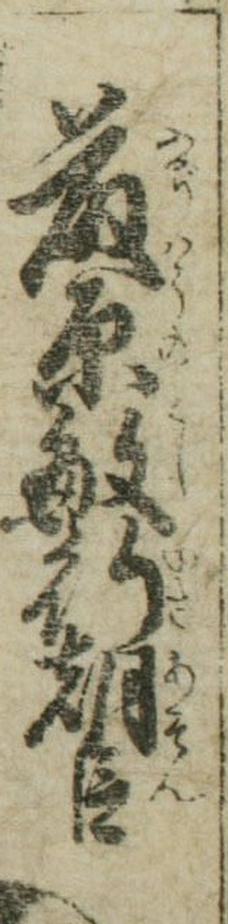藤原敏行朝臣
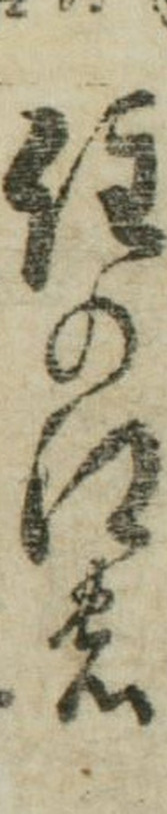住の江の
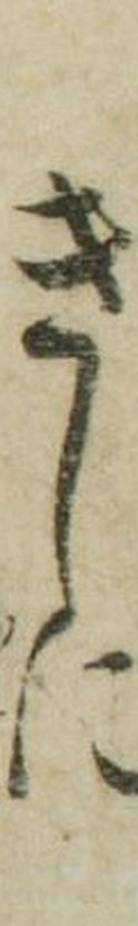きしに
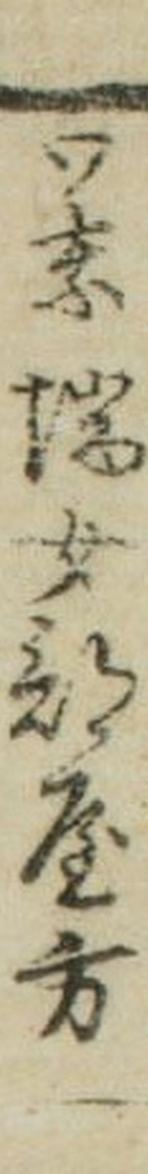御末端女部屋方
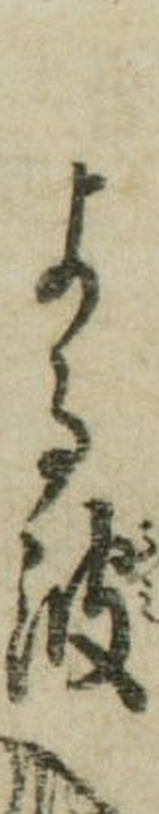よる波
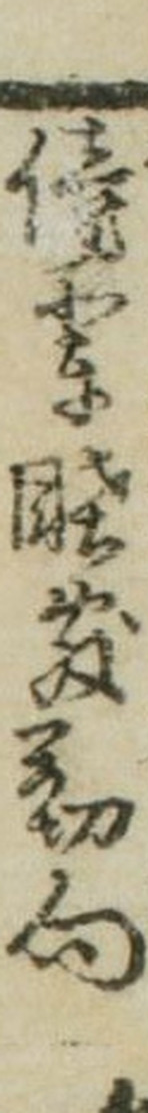傍輩睦敷勤向
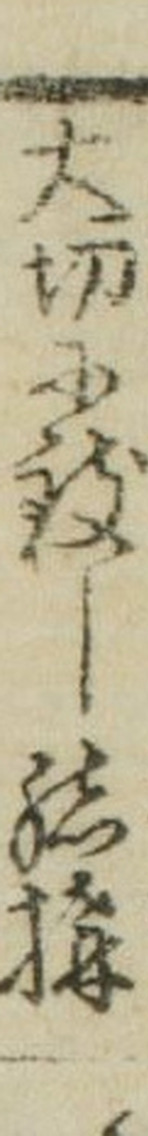大切に致し結構
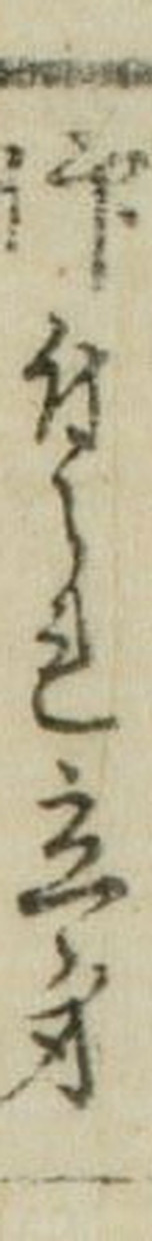仰付られ立身
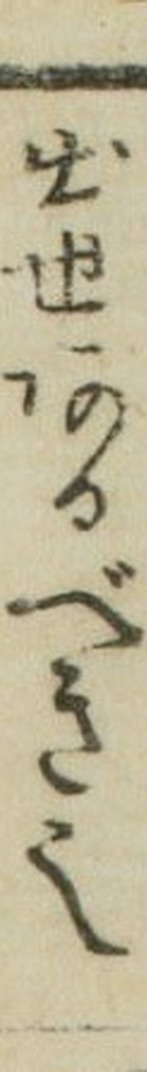出世あるべき也
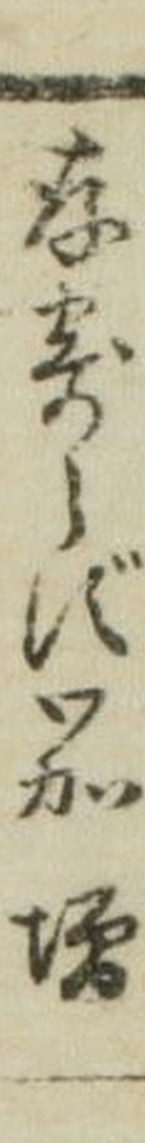存寄らず御加増
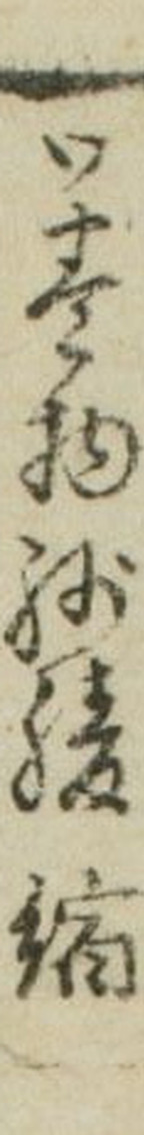御巻物紗綾縮
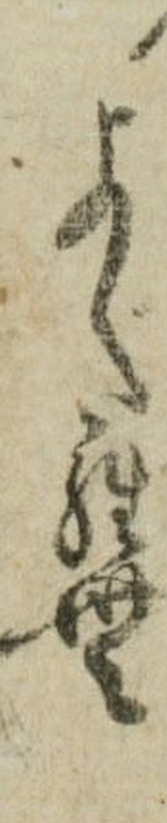よくらむ
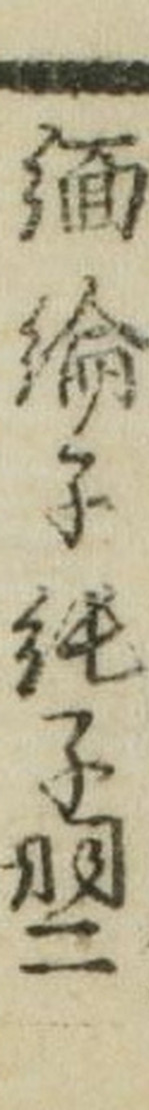緬綸子緞子羽二
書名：百人一首
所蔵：東京学芸大学教育コンテンツアーカイブ
